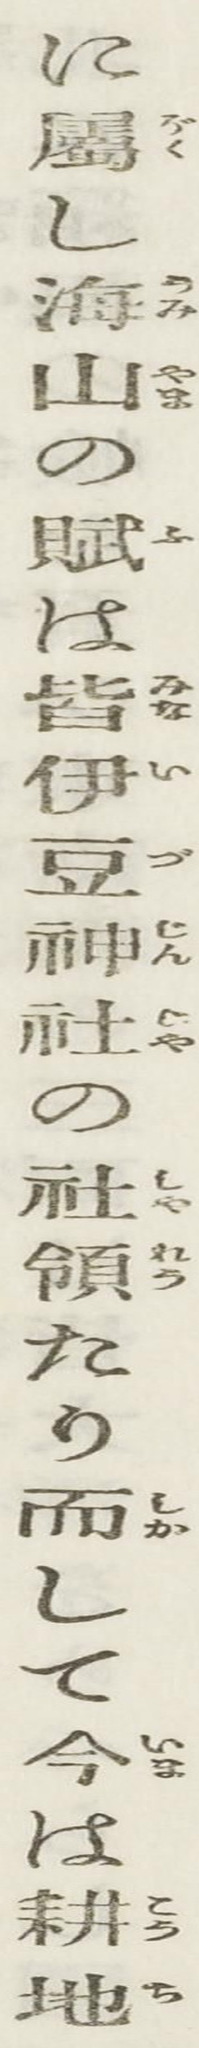に属し海山の賦は皆伊豆神社の社領たり而して今は耕地
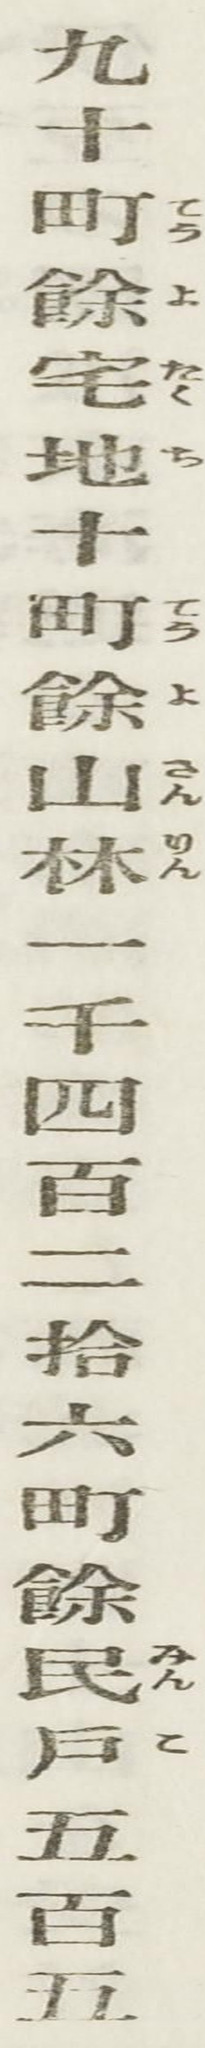九十町余宅地十町余山林一千四百二拾六町余民戸五百五
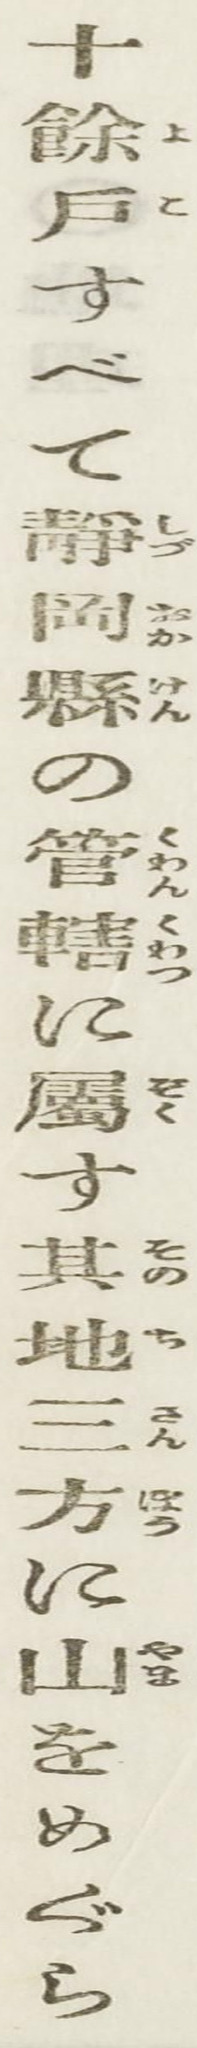十余戸すべて静岡県の管轄に属す其地三方に山をめぐら
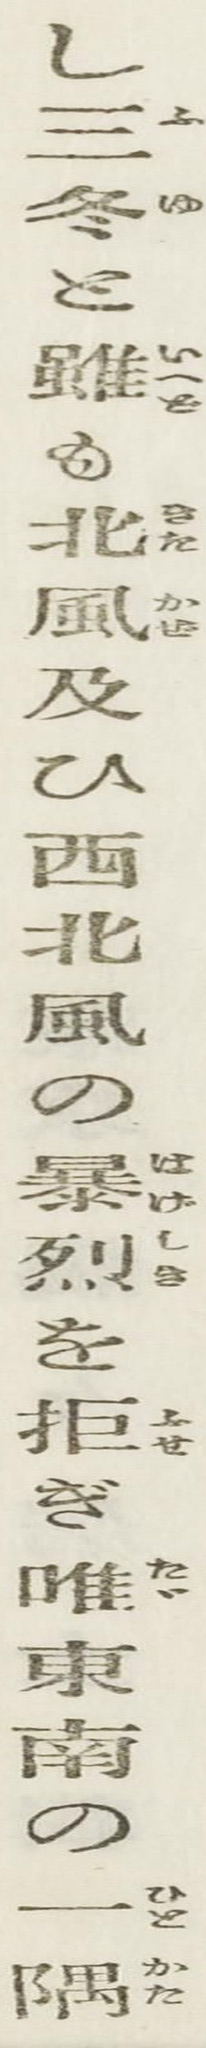し三冬と雖も北風及ひ西北風の暴烈を拒ぎ唯東南の一隅
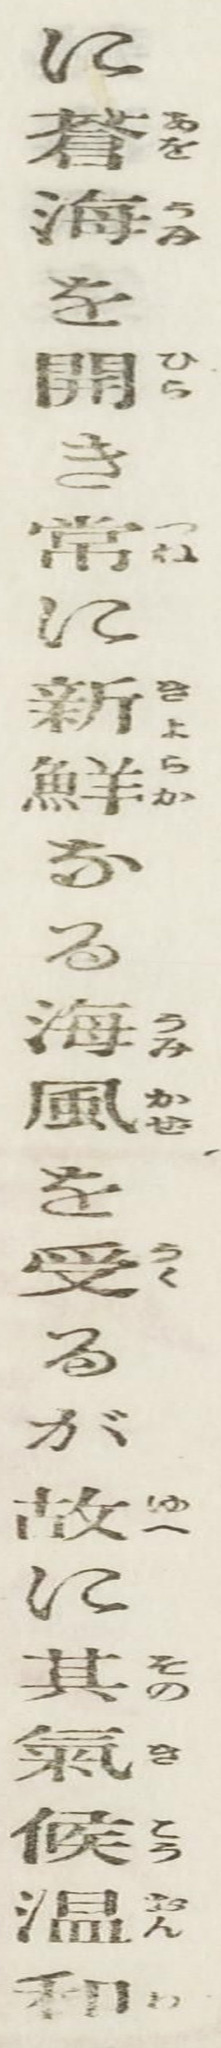に蒼海を開き常に新鮮なる海風を受るが故に其気候温和
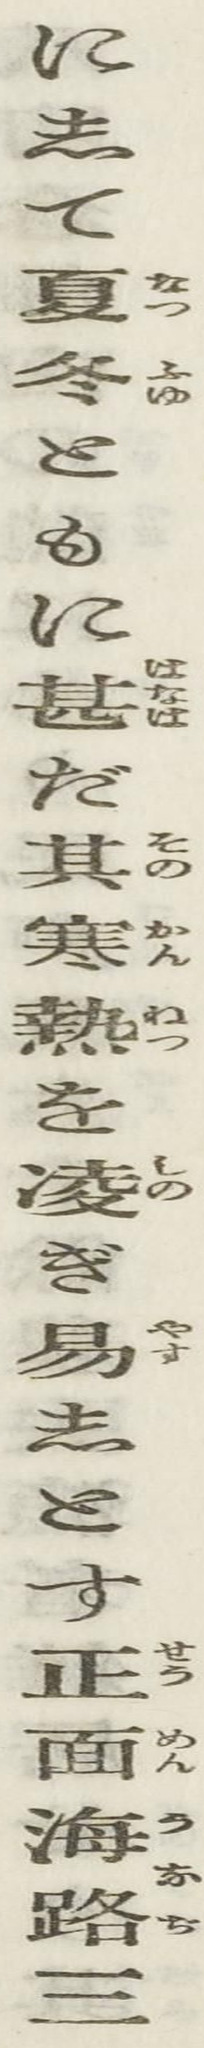にして夏冬ともに甚だ其寒熱を凌ぎ易しとす正面海路三
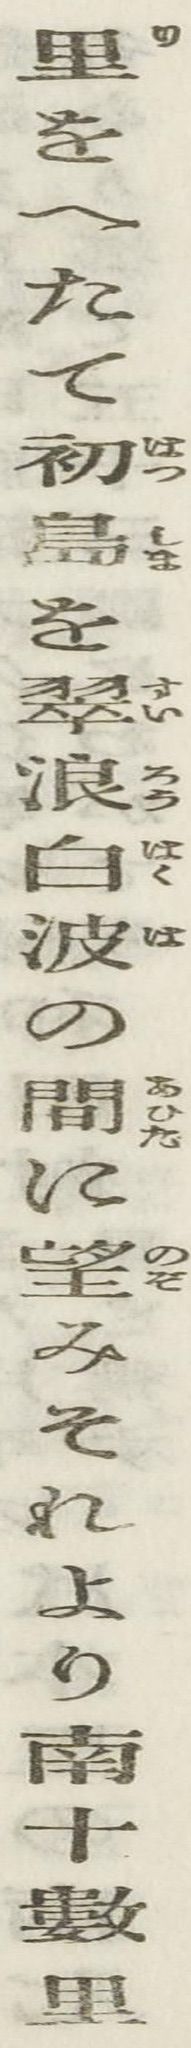里をへたて初島を翠浪白波の間に望みそれより南十数里
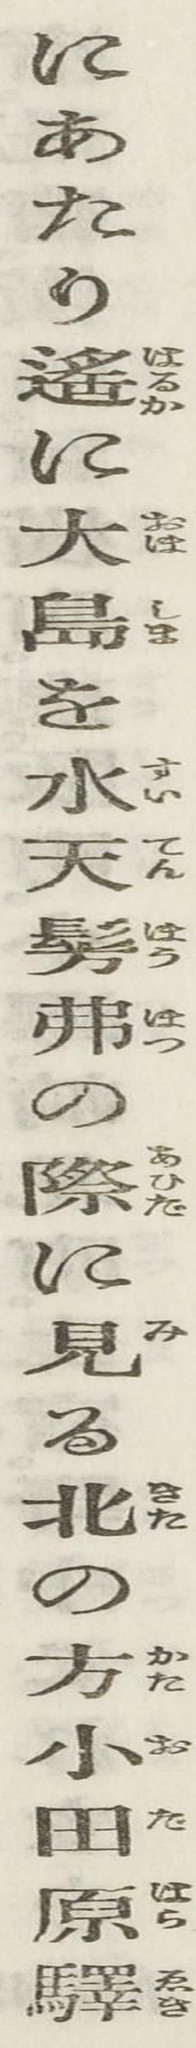にあたり遥に大島を水天髣弗の際に見る北の方小田原駅

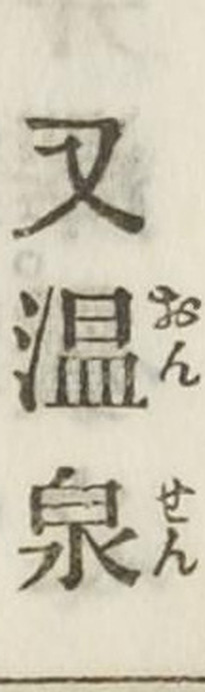○温泉
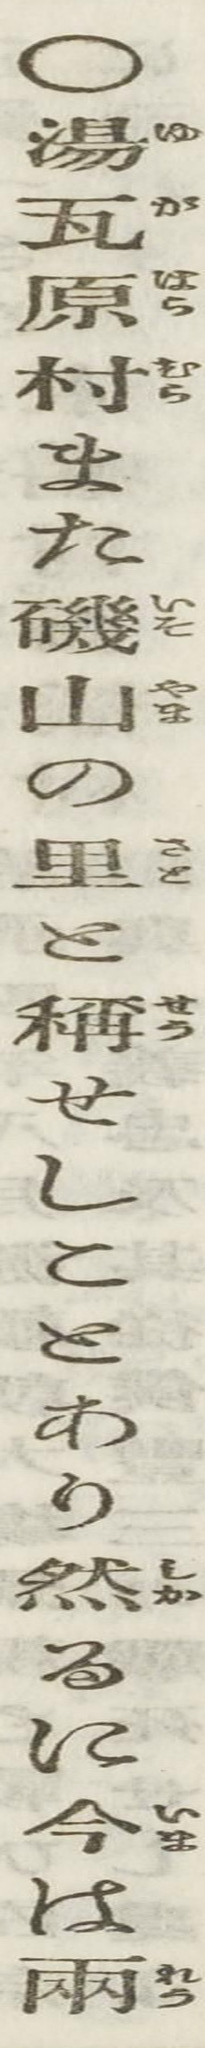○湯瓦原村また磯山の里と称せしことわり然るに今は両
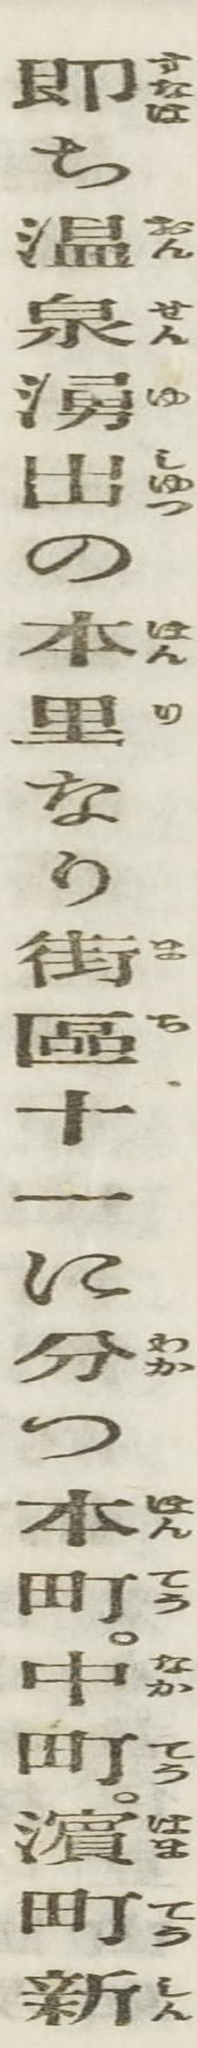即ち温泉湧出の本里なり街区十一に分つ本町。中町。浜町新
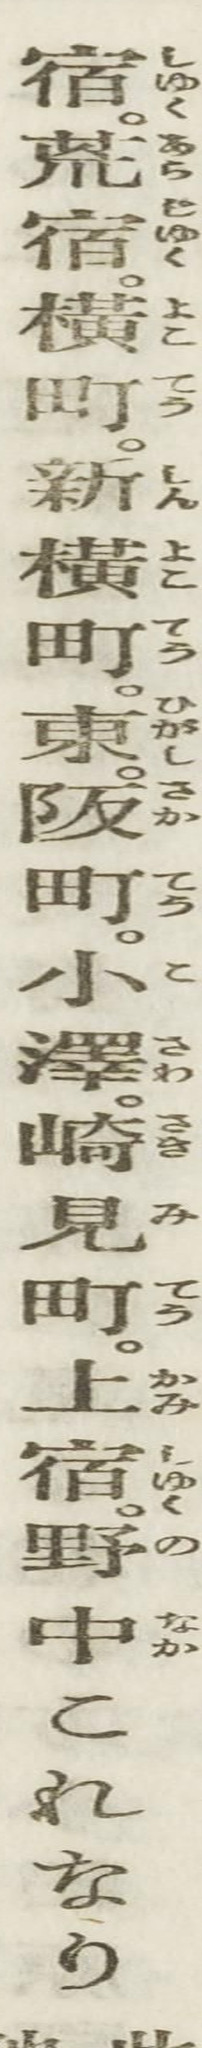宿。荒宿。横町。東。坂町。小澤。崎見町。上宿。野中これなり此他
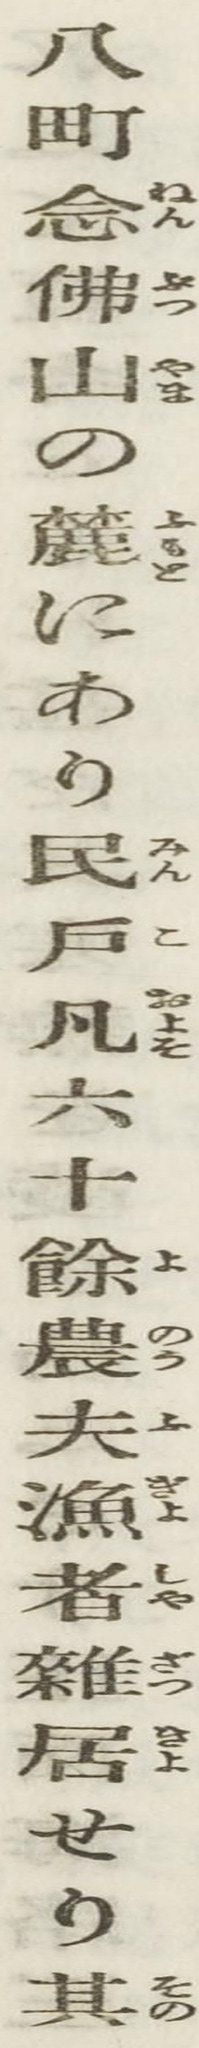八町念佛山の麓にあり民戸凡六十餘農夫漁者雑居せり其
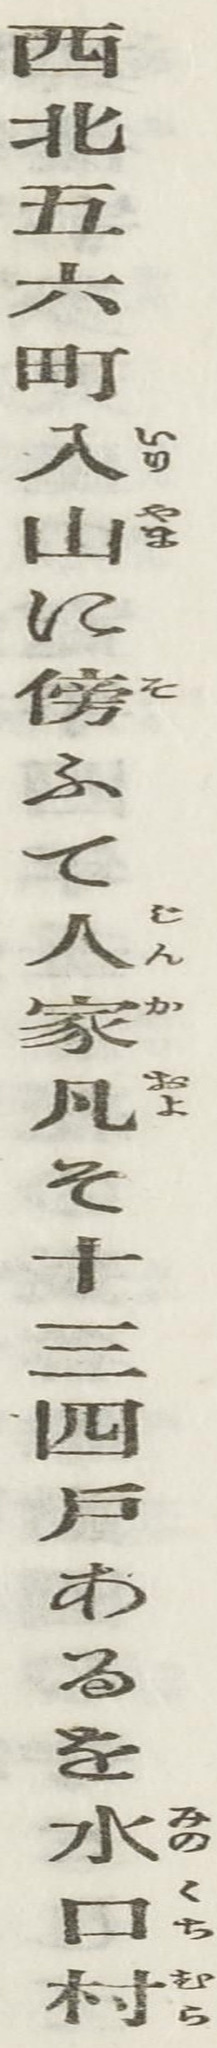西北五六町入山に傍ふて人家凡そ十三四戸あるを水口村
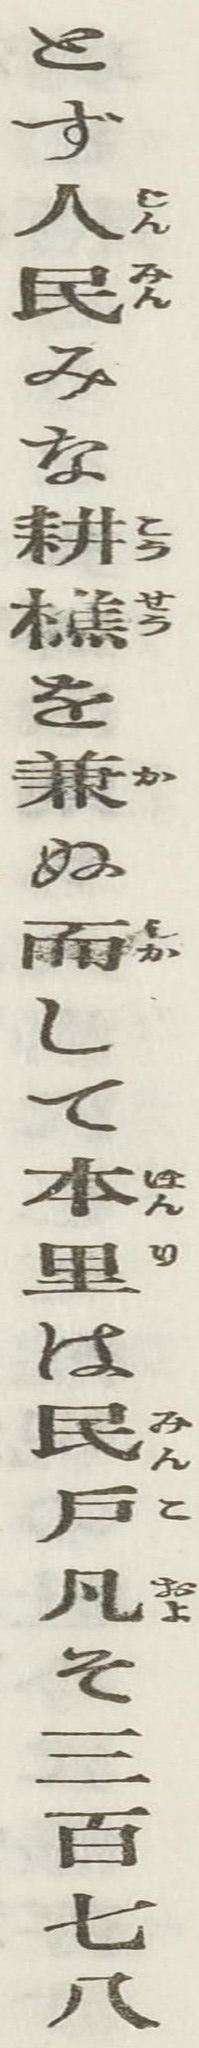とす人民みな耕樵を兼ぬ而して本里は民戸凡そ三百七八
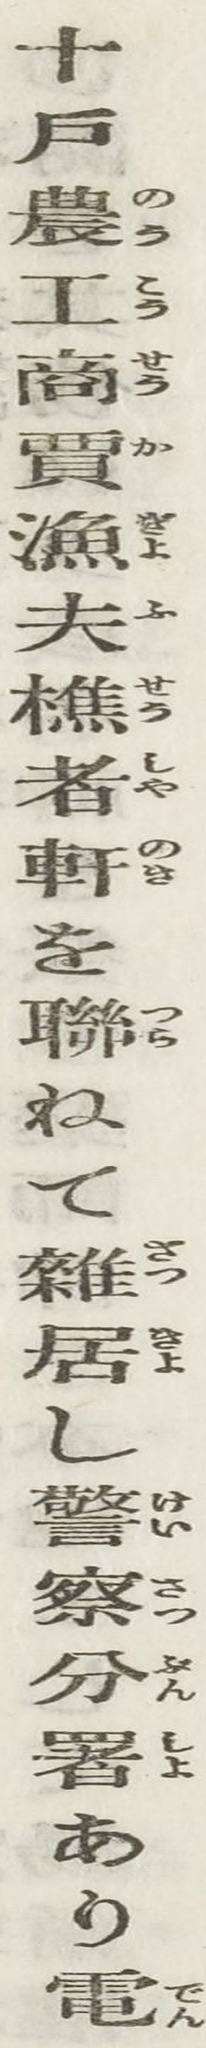十戸農工商賈漁夫樵者軒を聯ねて雑居し警察分署あり電
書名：熱海獨案内　全
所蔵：東京大学地震研究所図書室 Earthquake Research Institute Library, The University of Tokyo, JAPAN
